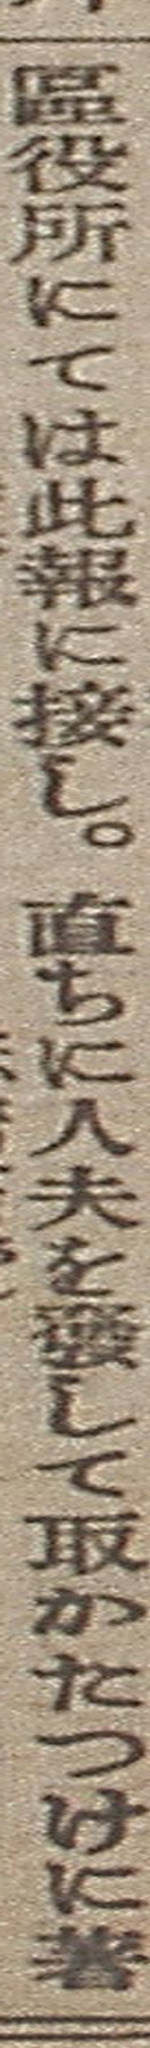区役所にては此報に接し。直ちに人夫を発して取かたつけに著
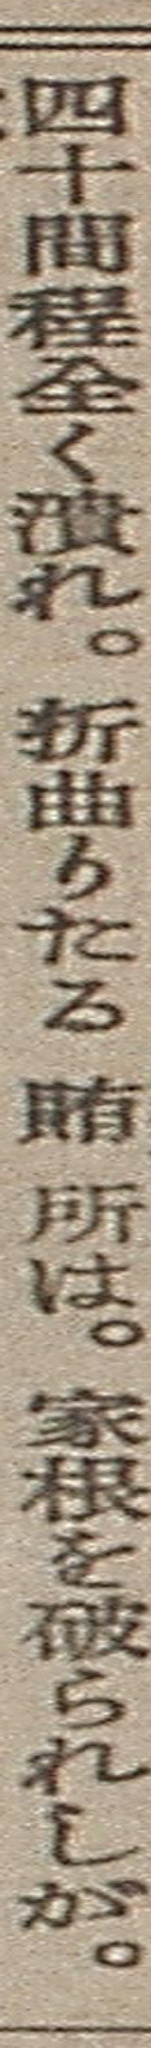四十間程全く潰れ。折曲りたる賄所は。家根を破られしが。
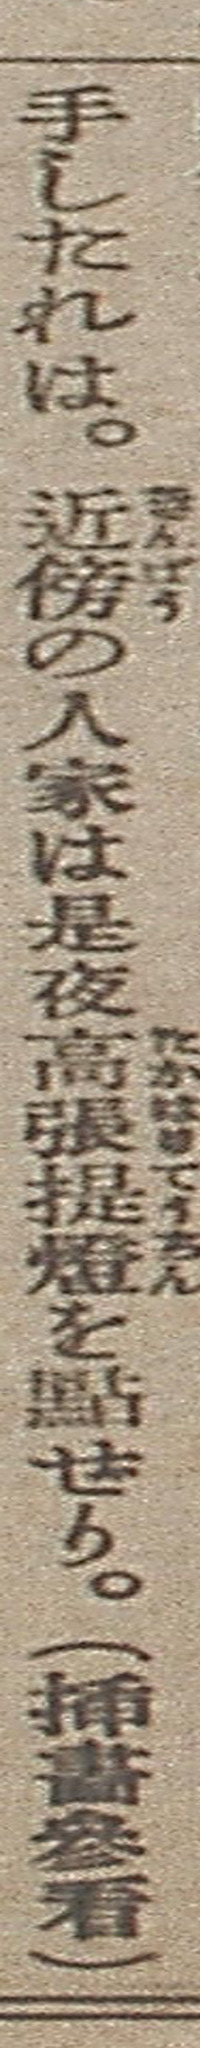手したれは。近傍の人家は是夜高張提燈を点ぜり。
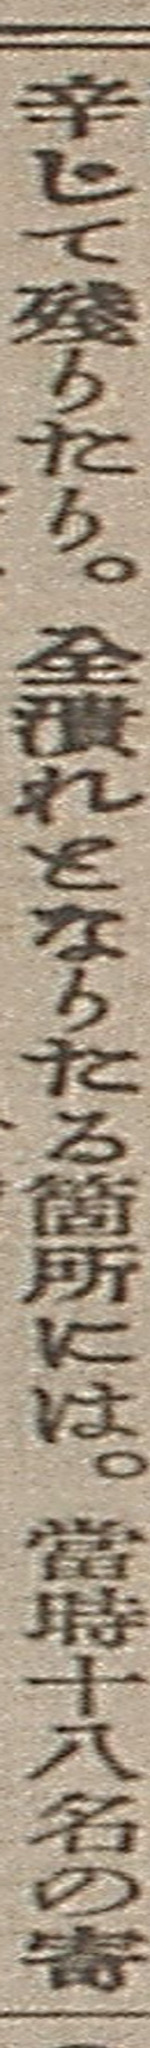辛じて残りたり。全潰れとなりたる箇所には。当時十八名の寄
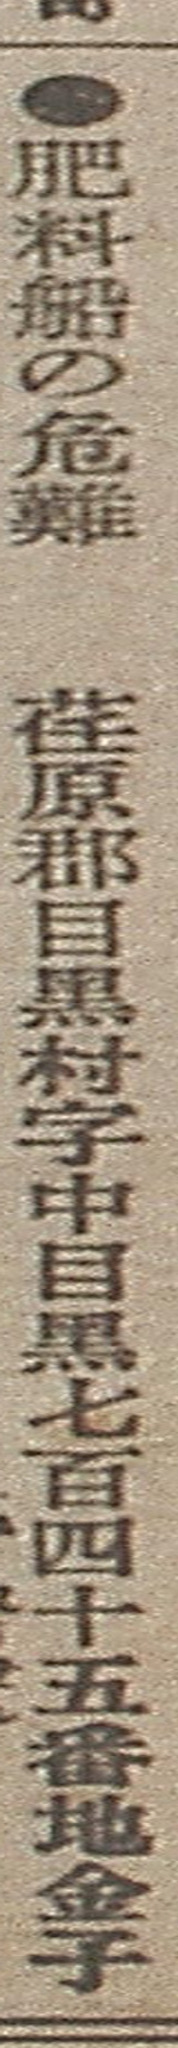●肥料船の危難荏原郡目黒村字中目黒七百四十五番地金子
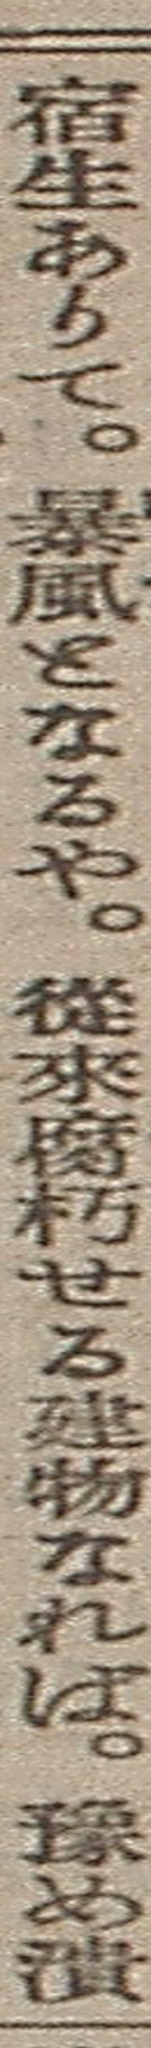宿生ありて。暴風となるや。従来腐朽せる建物なれば。予め潰
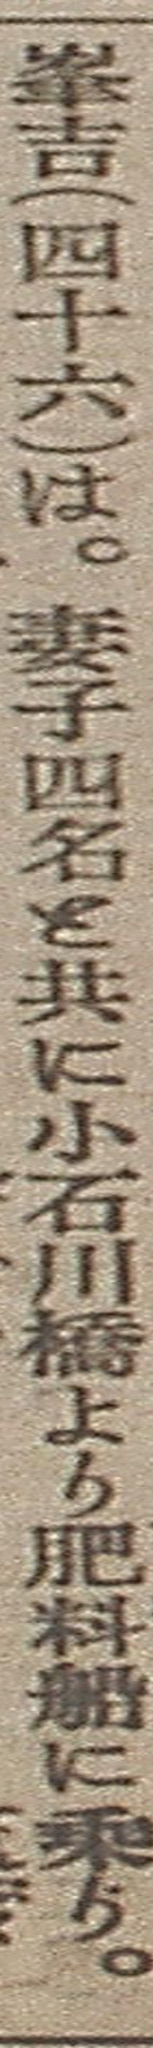峯吉は。妻子四名と小石川橋より肥料船に乗り。
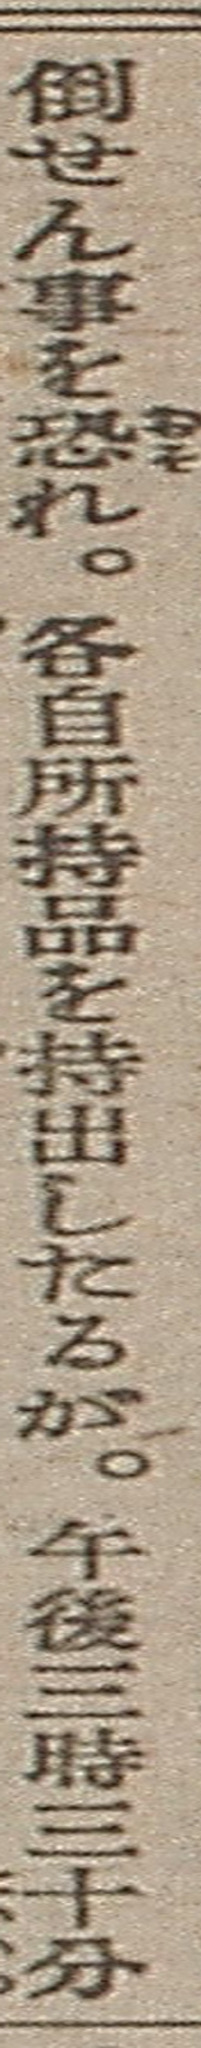倒せん事を恐れ。各自所持品を持出したるが。午後三時三十分
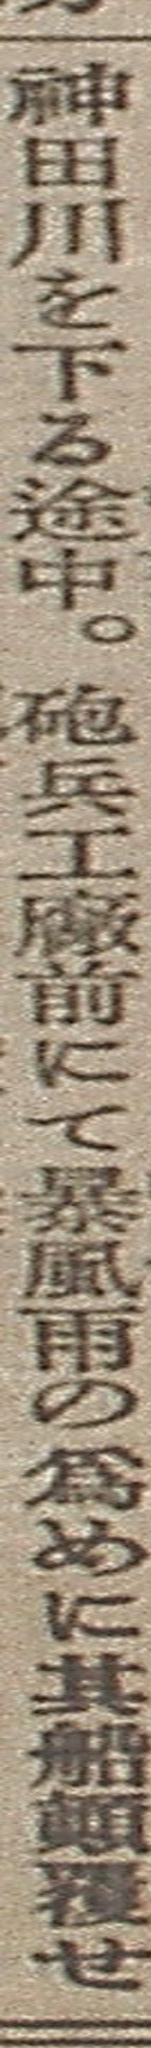神田川を下る途中。砲兵工廠前にて暴風雨の為めに其船転覆せ
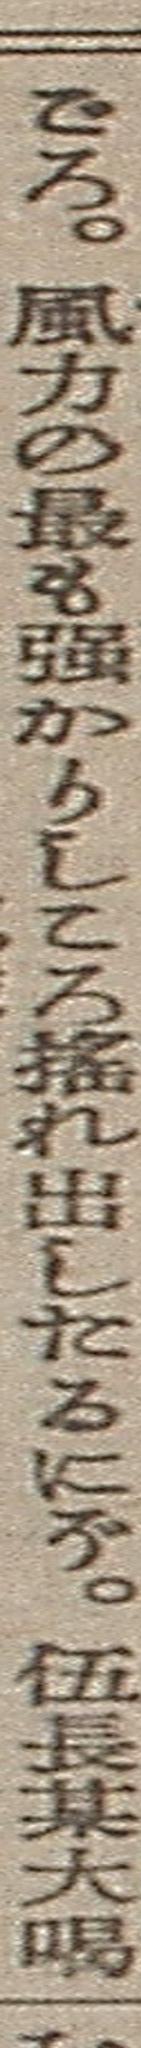ごろ。風力の最も強かりしころ揺れ出したるにぞ。伍長某大喝
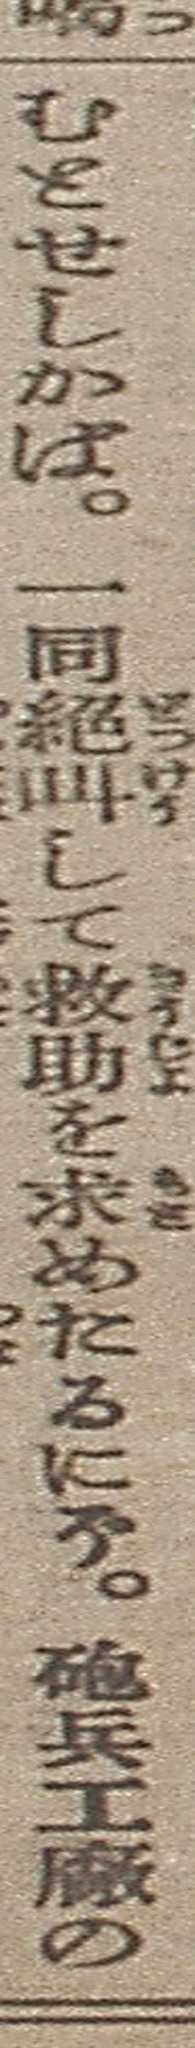むとせしかば。一同絶叫して救助を求めたるにぞ。砲兵工廠の
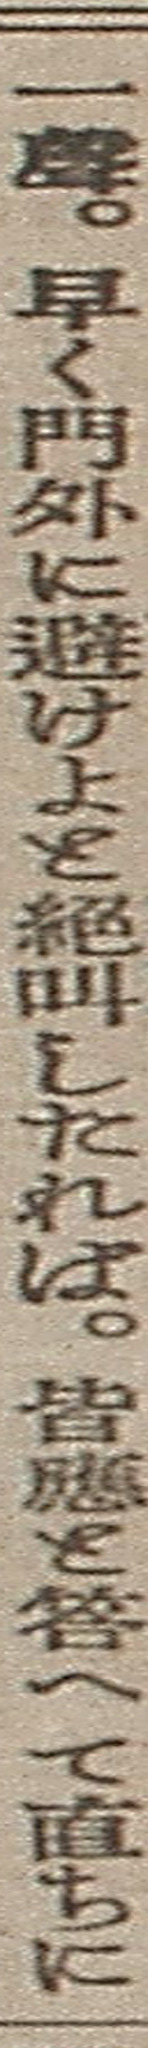一声。早く門外に避けよと絶叫したれば。皆応と答へて直ちに
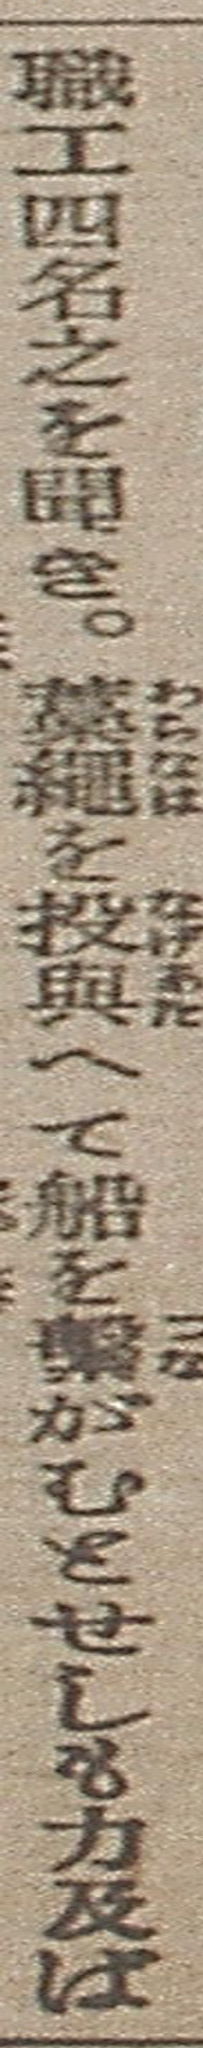職工四名之を聞き。藁縄を投与へて船を繋がむとせしも力及ば
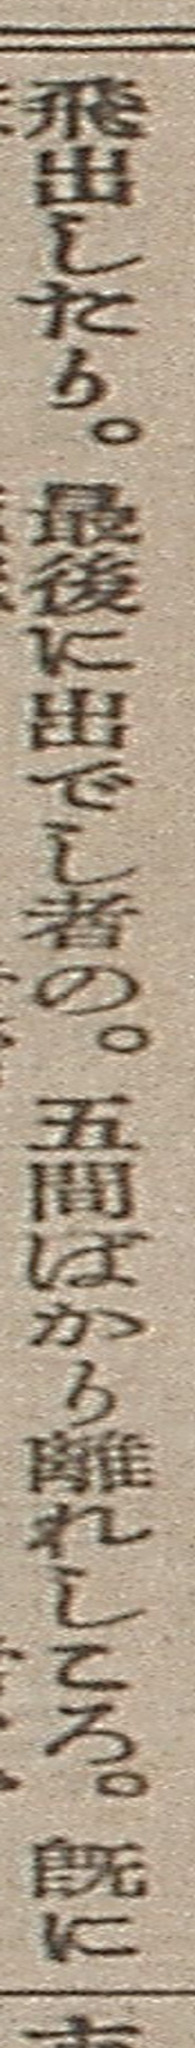飛出したり。最後に出でし者の。五間ばかり離れしころ。既に
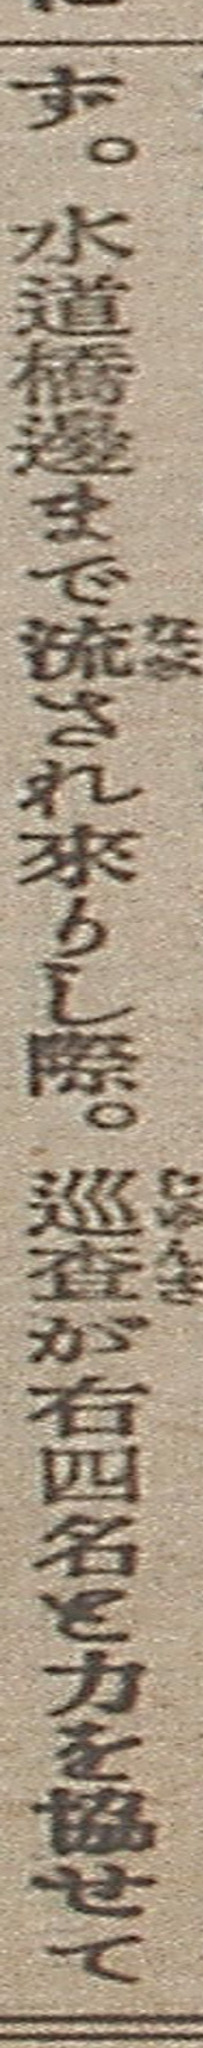ず。水道橋辺まで流され来りし際。巡査が右四名と力を協せて
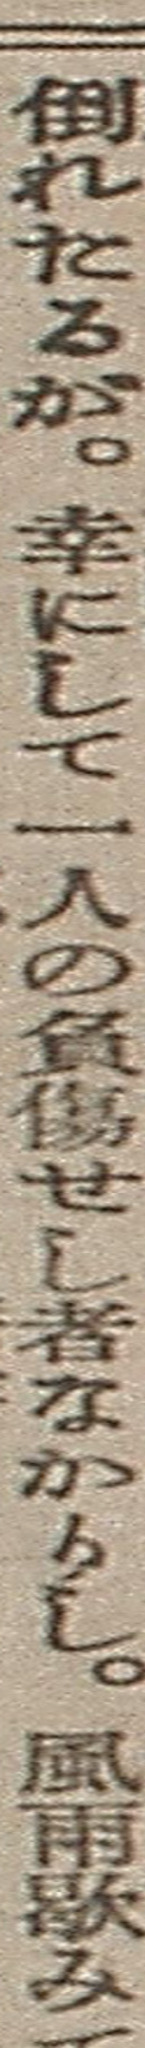倒れたるが。幸にして一人の負傷せし者なかりし。風雨歇みて
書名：風俗畫報臨時増刊第百九十九號　明治三十二年十月各地災害圖會（前編之續）
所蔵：東京大学地震研究所図書室 Earthquake Research Institute Library, The University of Tokyo, JAPAN
